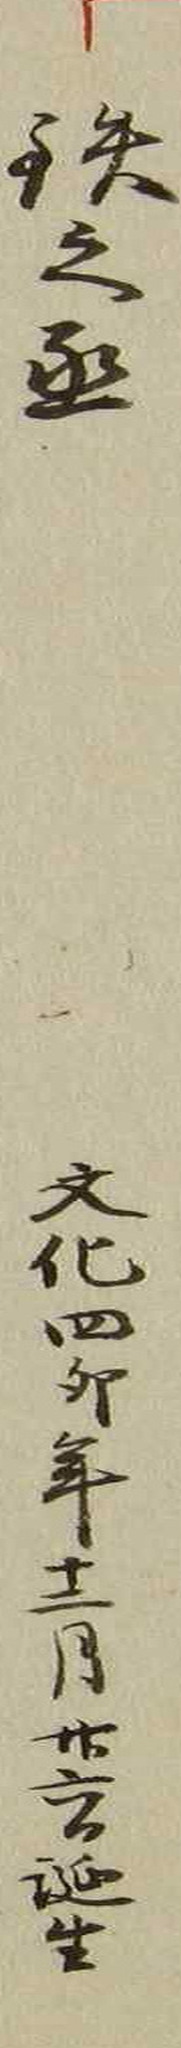鉄之丞文化四卯年二月廿六日誕生
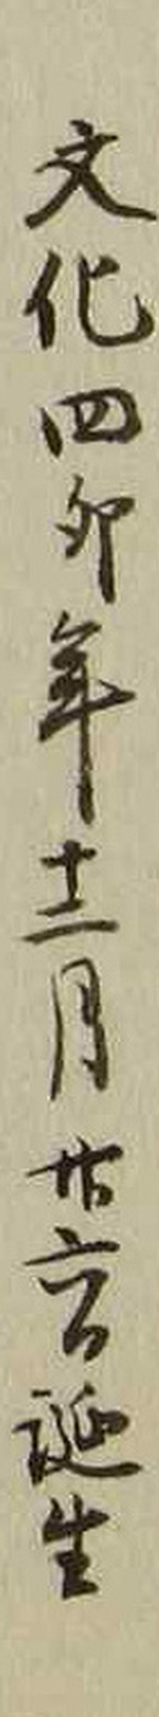鉄之丞文化四卯年二月廿六日誕生
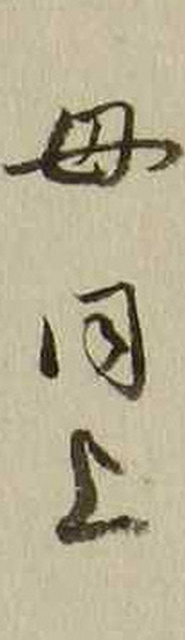母同上
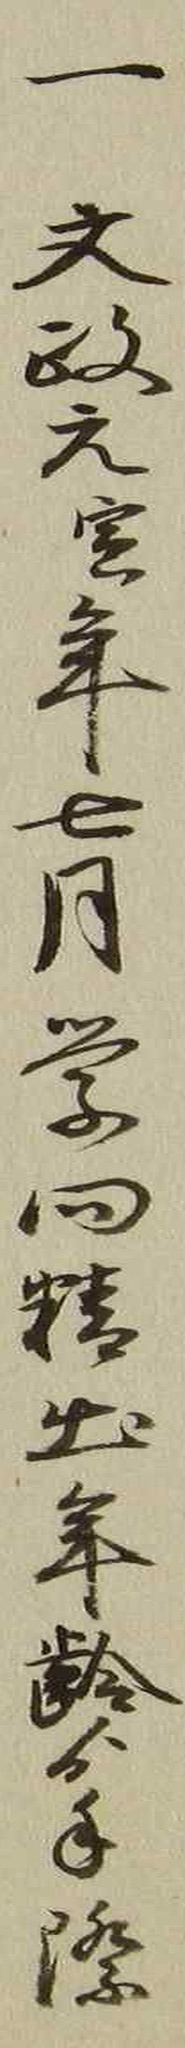一文政元寅年七月学問精出年齢ゟ手際
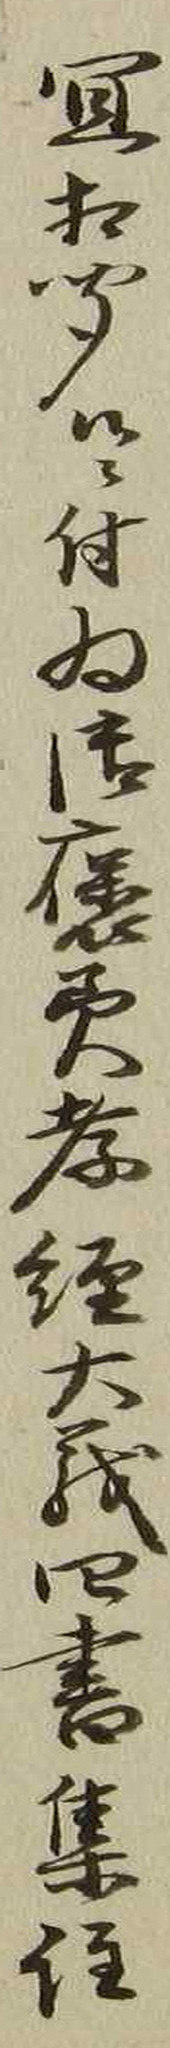宜相聞候に付為御褒美孝経大義四書集住
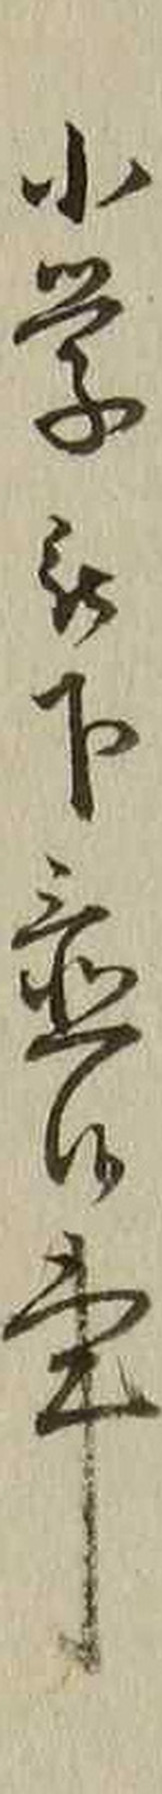小学被下置候事
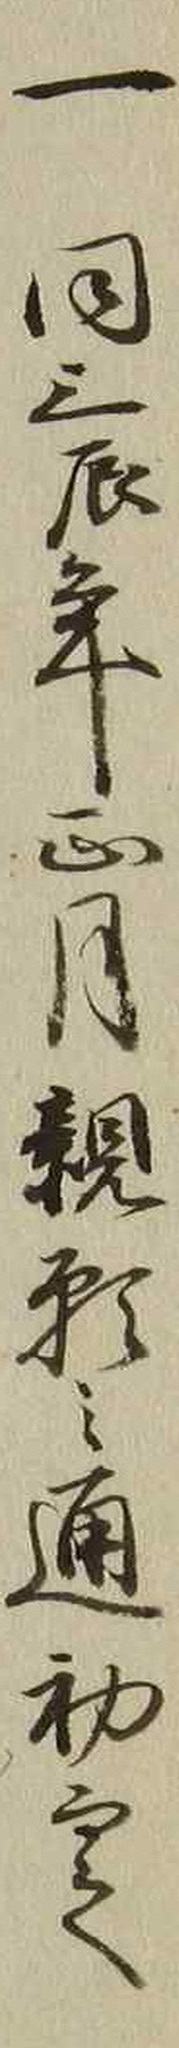一同三辰年正月親願之通初而之
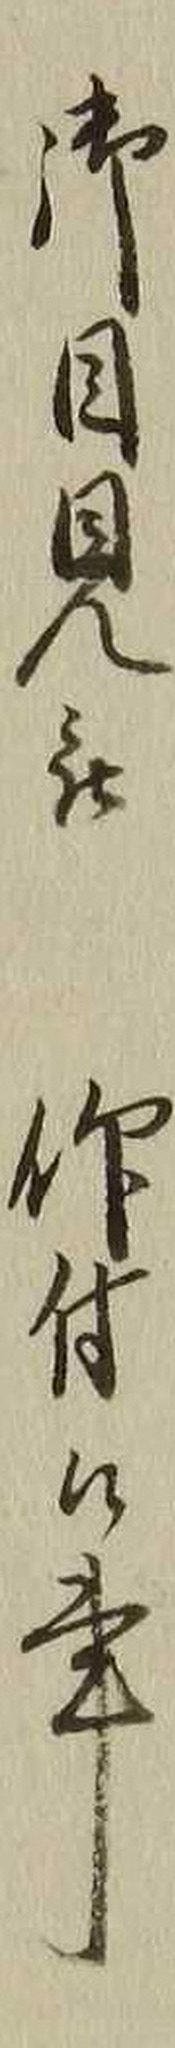御目見被仰付候事
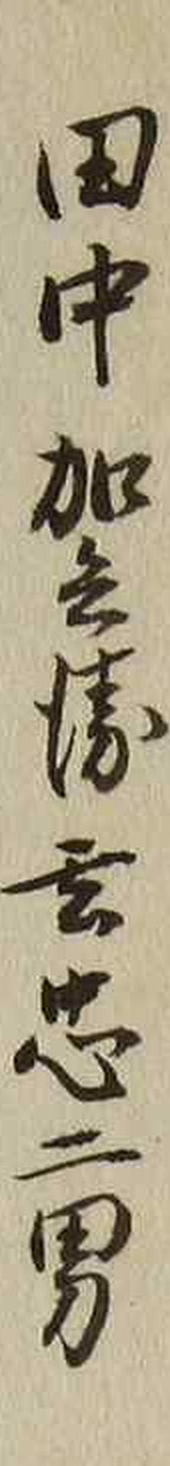田中加兵衛玄忠二男
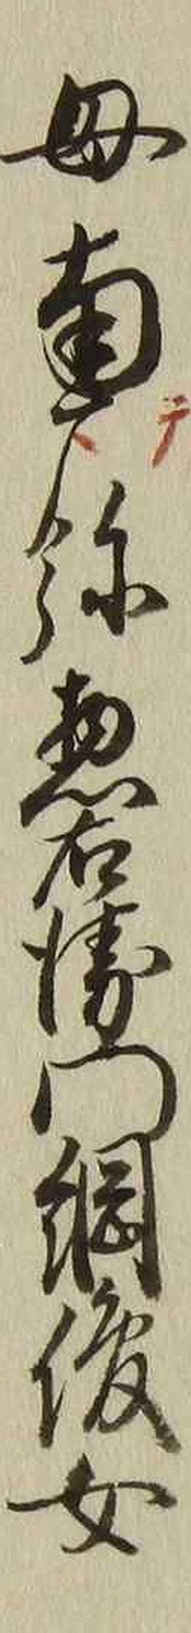母南弥惣右衛門綱俊女子
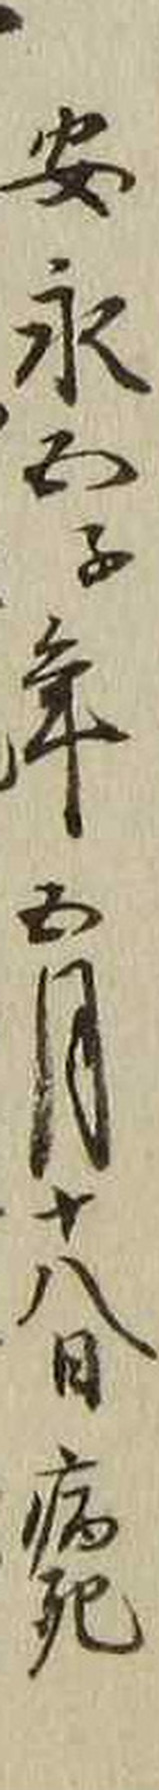安永五子年五月十八日病死
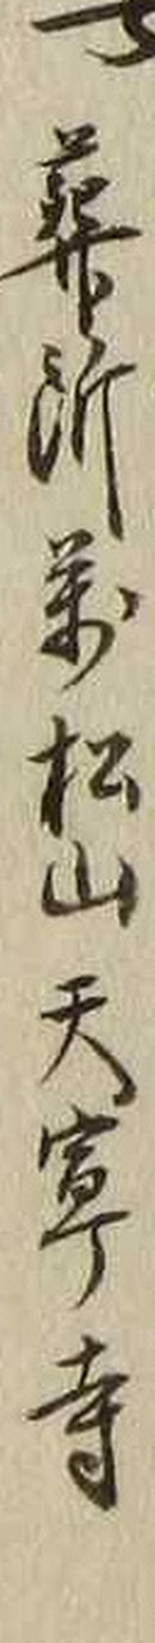葬所万松山天寧寺
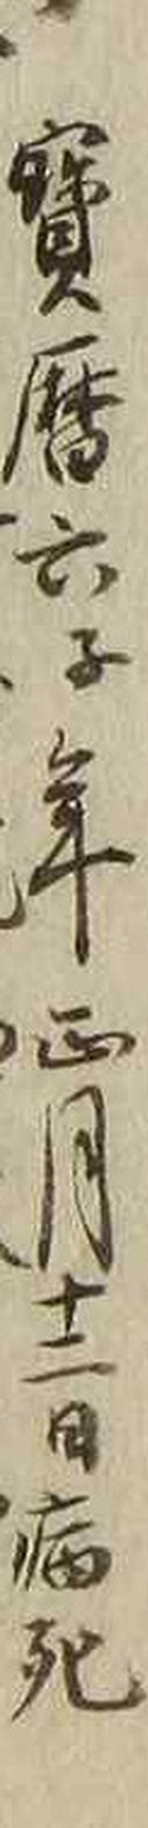宝暦六子年正月十二日病死
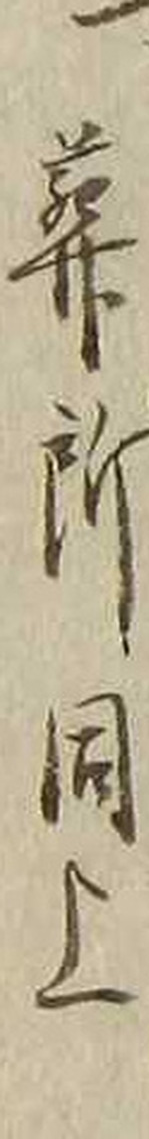葬所同上
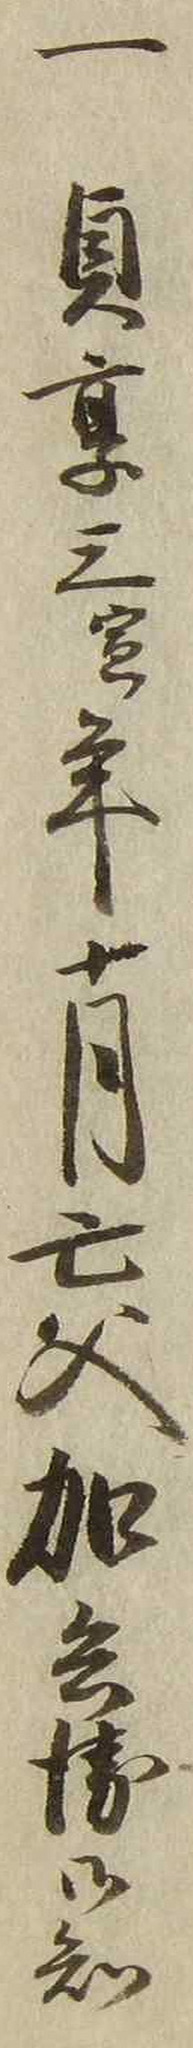一貞享三寅年十月亡父加兵衛御知

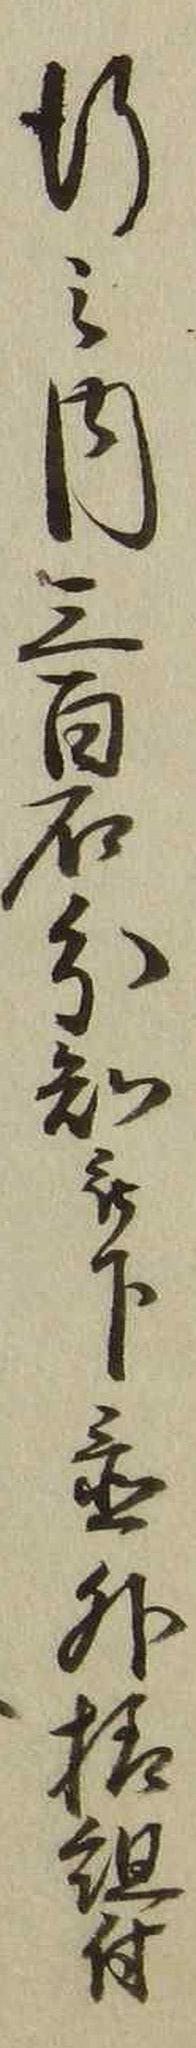行之内三百石分知被下置外様組付
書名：諸士系譜　巻之133　た之部9
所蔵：会津若松市立会津図書館
